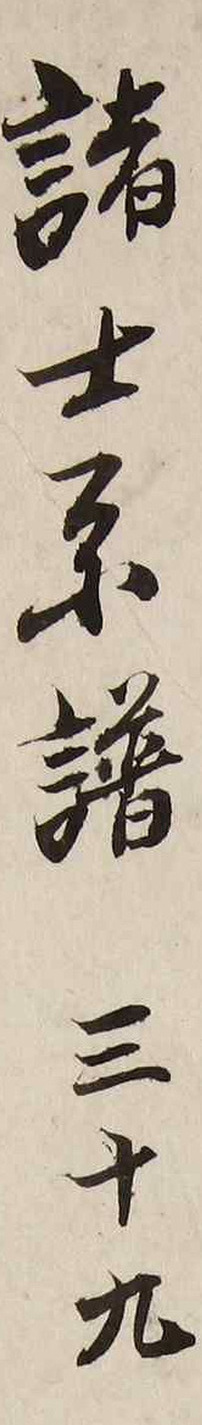諸士系譜三十九

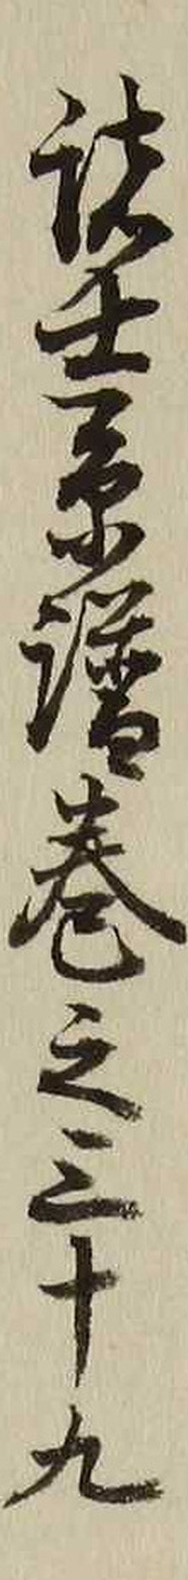諸士系譜巻之三十九
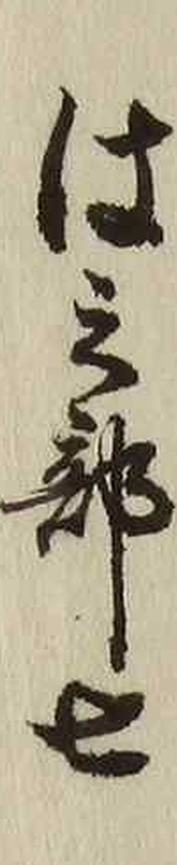は之部七
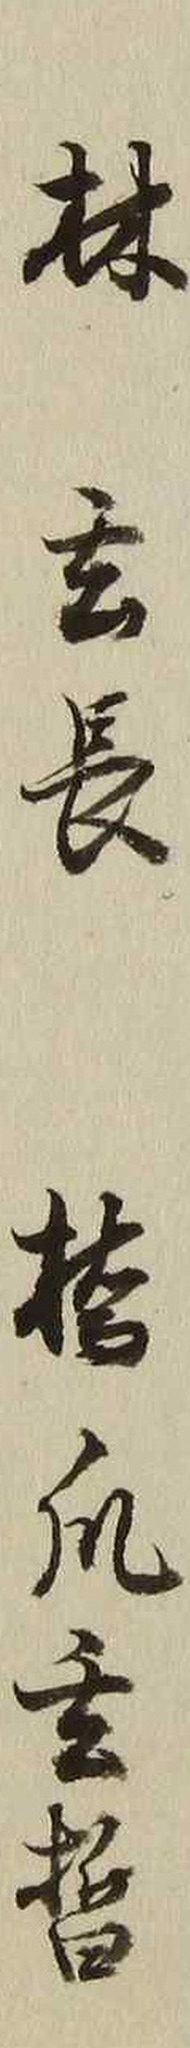林玄長橋爪玄哲
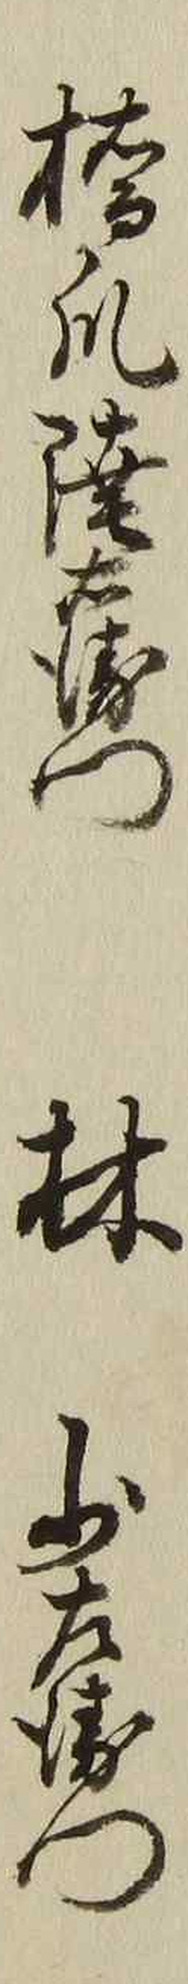橋爪陸右衛門林少左衛門

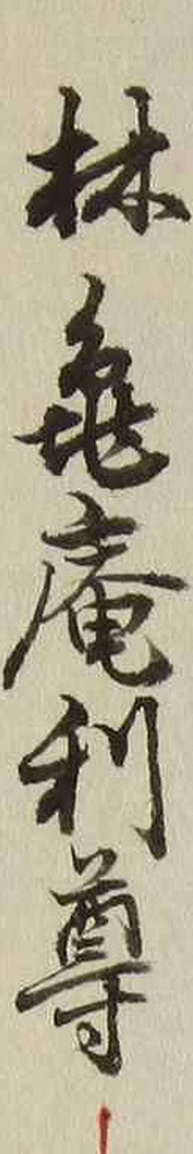林亀庵利尊
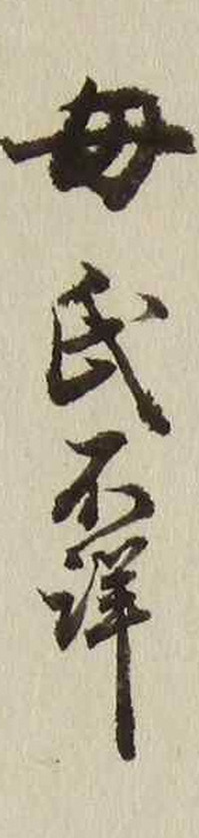母氏不詳
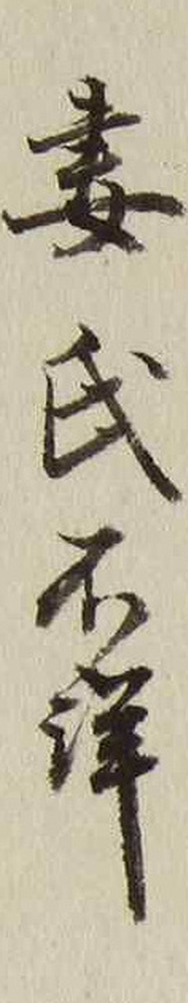妻氏不詳
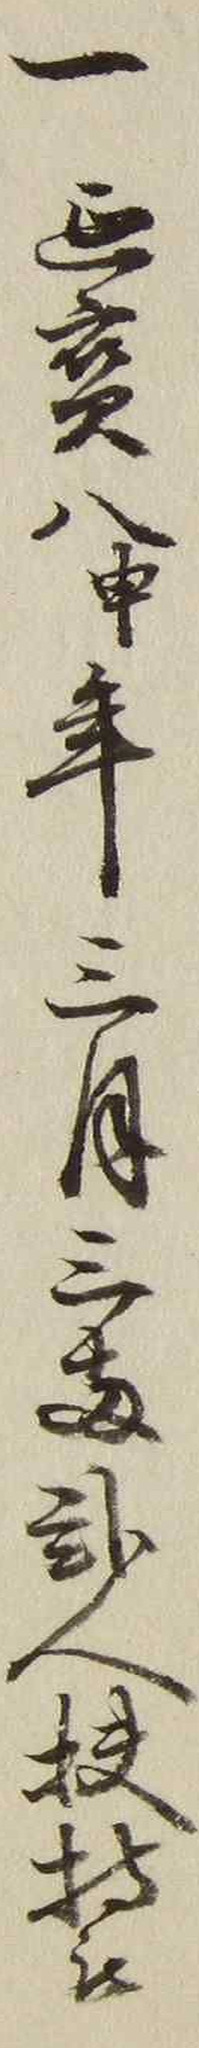一延宝八申年三月三両弐人扶持被

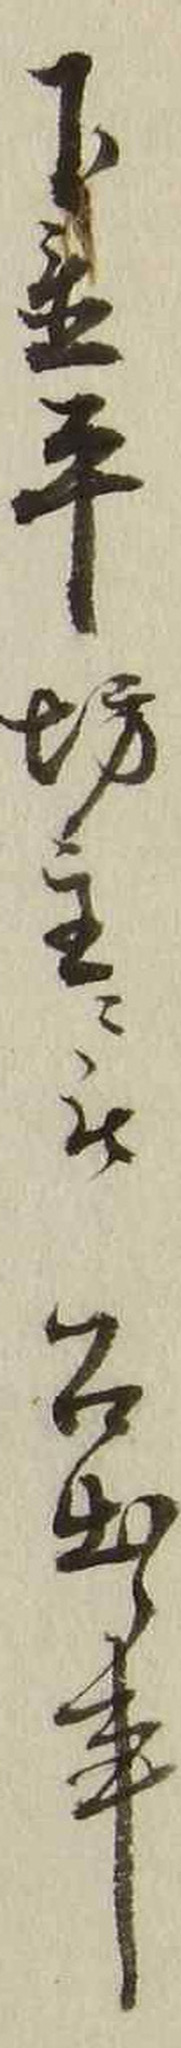下置平坊主ニ被召出候事
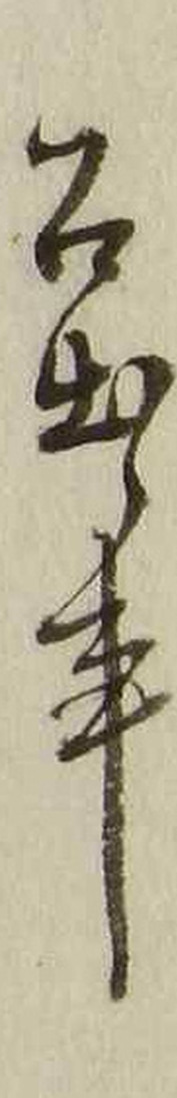召上候事
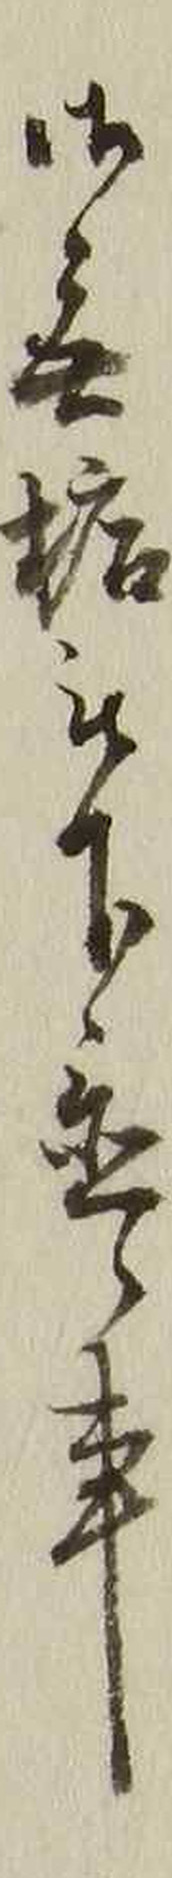御無垢被下置候事
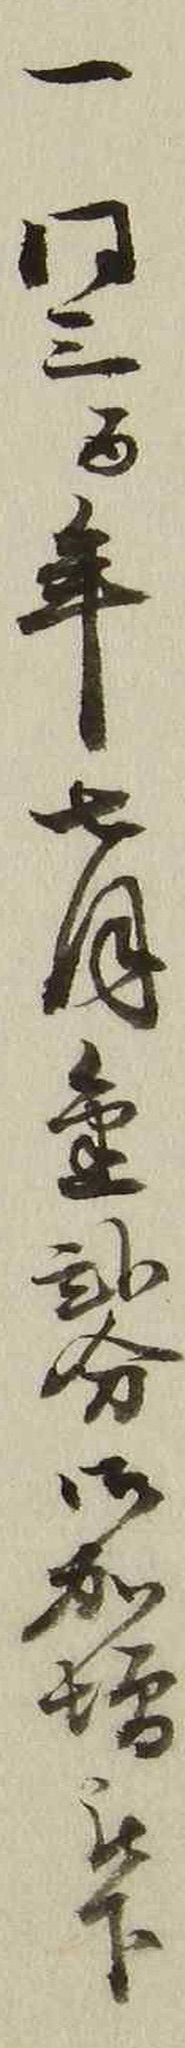一同三酉年七月金弐分御加増被下
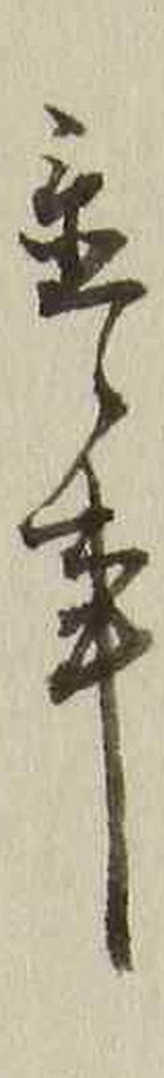置候事
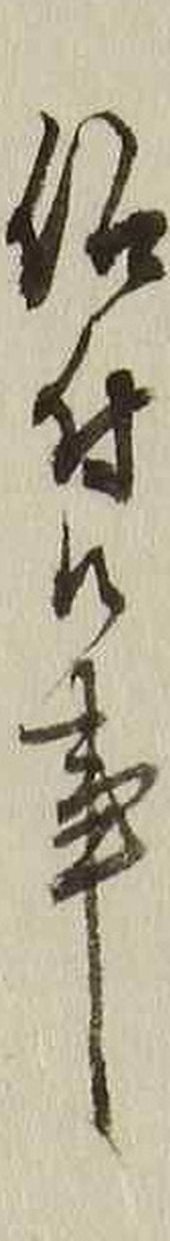仰付候事
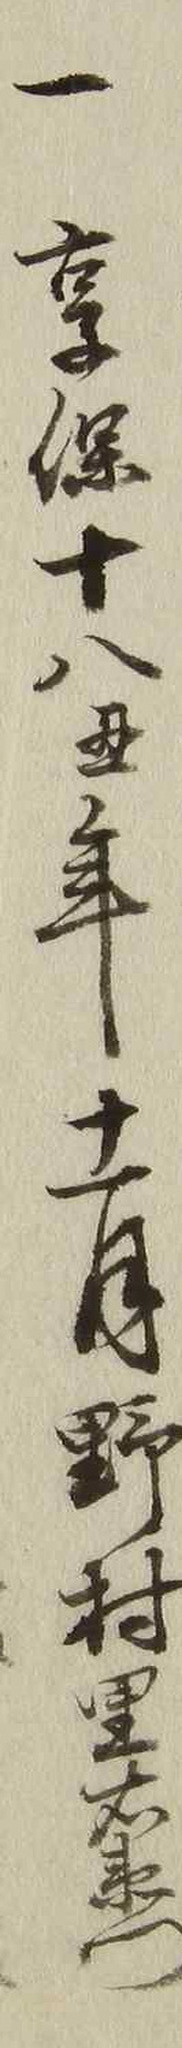一享保十八丑年十一月野村里右衛門
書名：諸士系譜　巻之39　は之部7
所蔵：会津若松市立会津図書館
